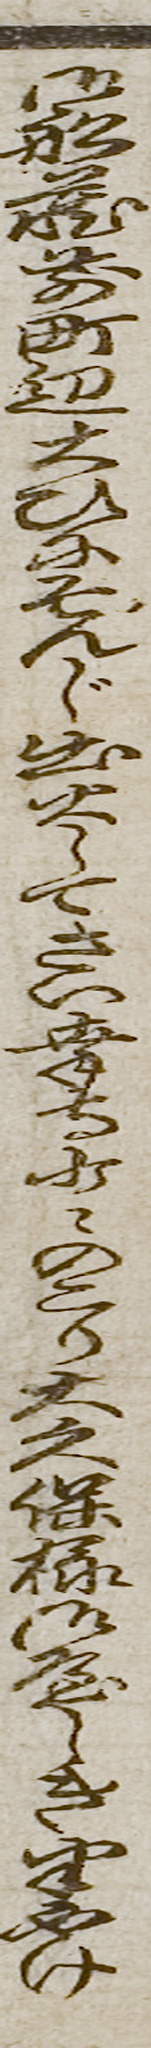御船蔵前町辺大ひにそんじ出火してさい幸寺少々のこり大久保様御屋しき半やけ
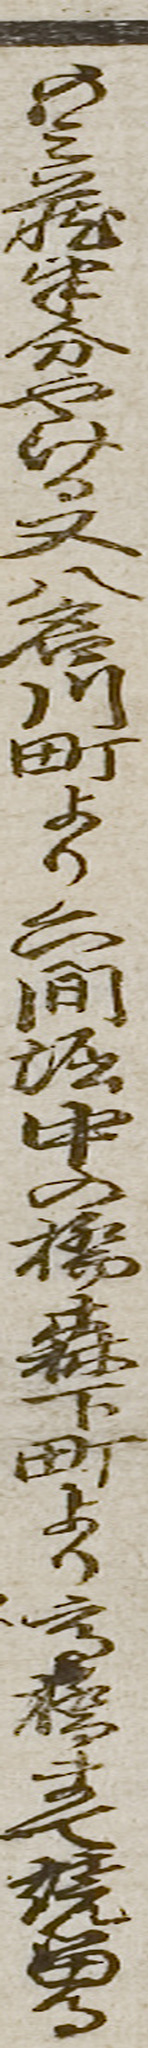のみ蔵半分やける又八名川町より六間堀中の橋森下町より高橋まで焼留る
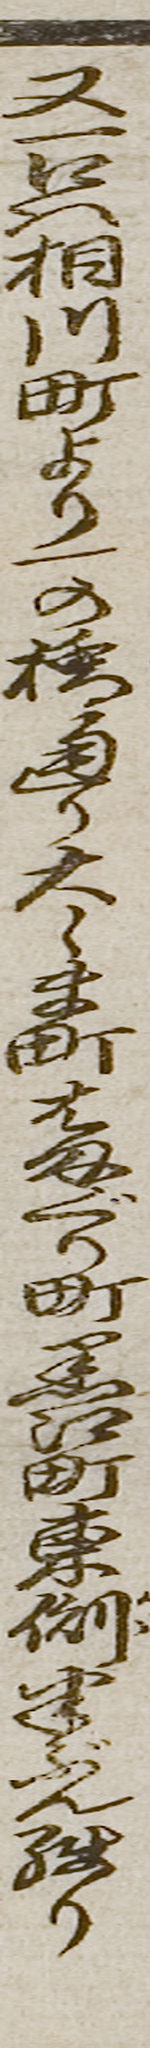又一口は相川町より一の橋通り大しま町はまぐり町黒江町東側半ぶん残り
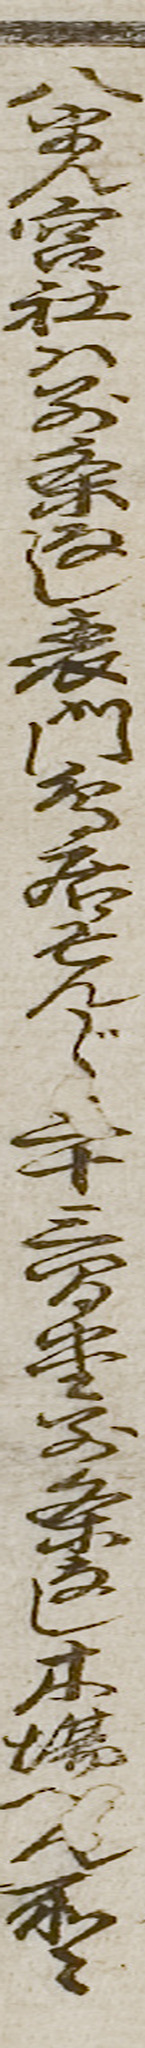八まん宮社は別条なし表門鳥居そんじ三十三間堂別条なし木場へん所々
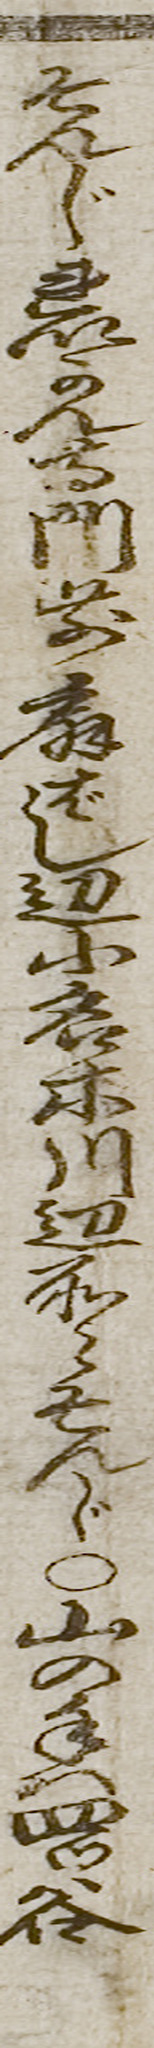そんじれいかん寺門前扇ばし辺小名木川辺所々そんじ〇山の手は四ツ谷
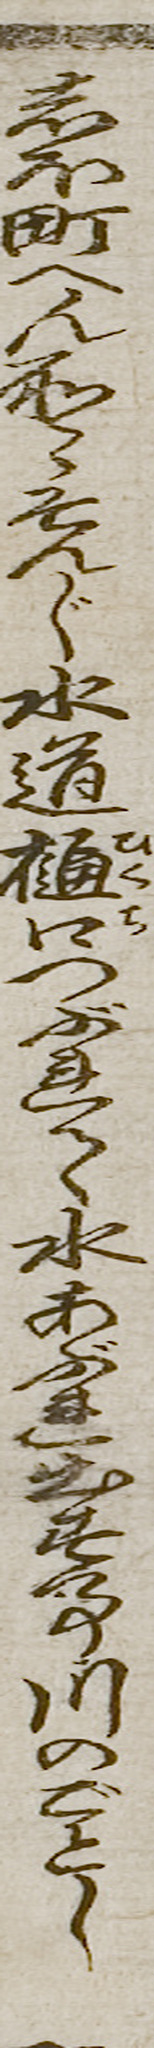しほ町へん所々そんじ水道樋口つぶれて水あぶれ出す事川のごとし
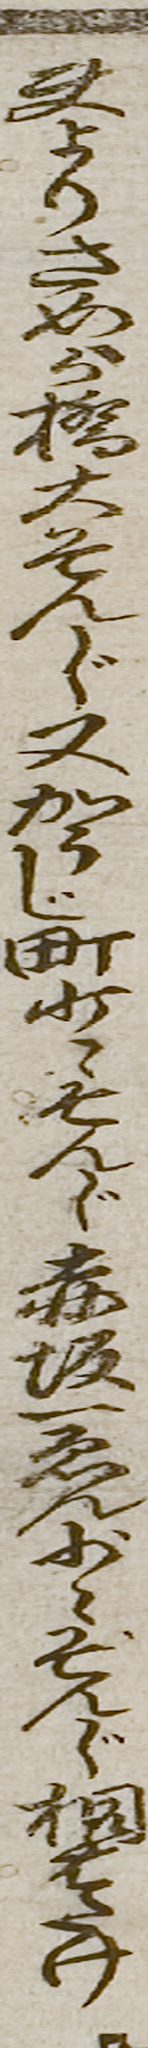夫よりさめが橋大そんじ又かうじ町少々そんじ赤坂一ゑん少々そんじ相はたけ
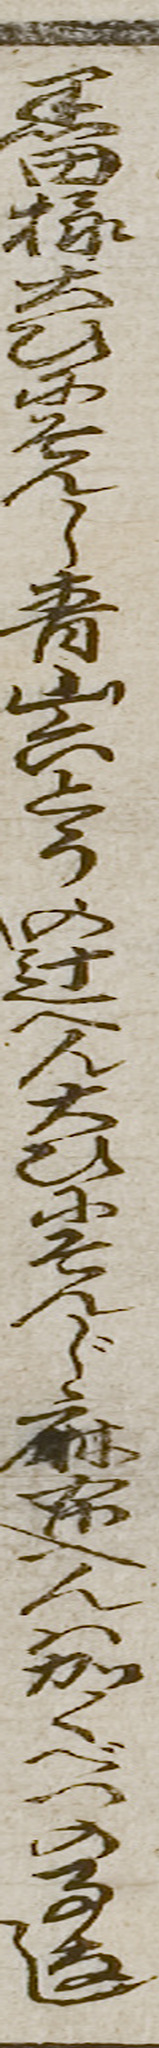黒田様大ひにそんし青山六とうの辻へん大にそんじ麻布へんはかくべつの事なし
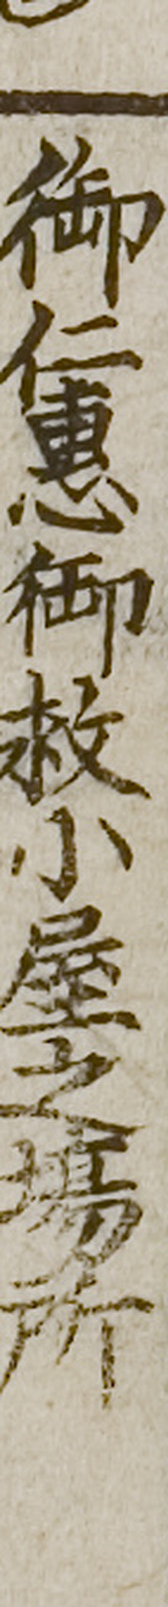御仁恵御救小屋之場所
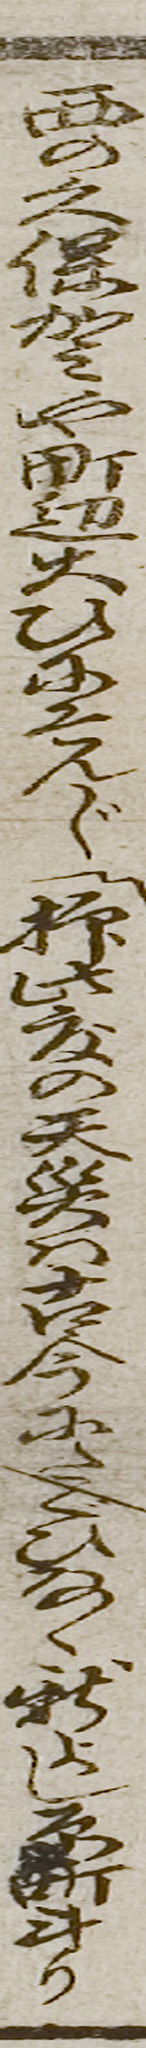西の久保かみや町辺大にそんじ歌い抑此度の天災は古今にたぐひなく新よし原町斗り
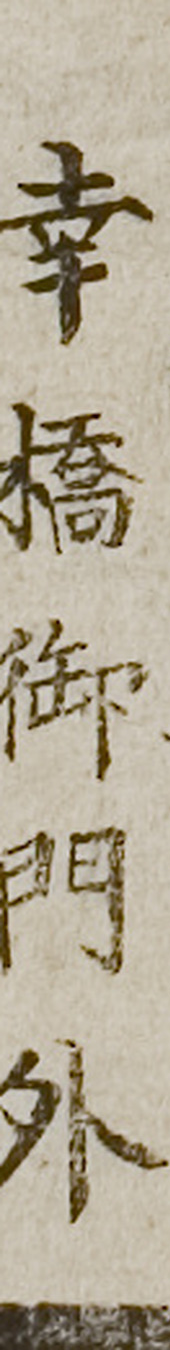幸橋御門外
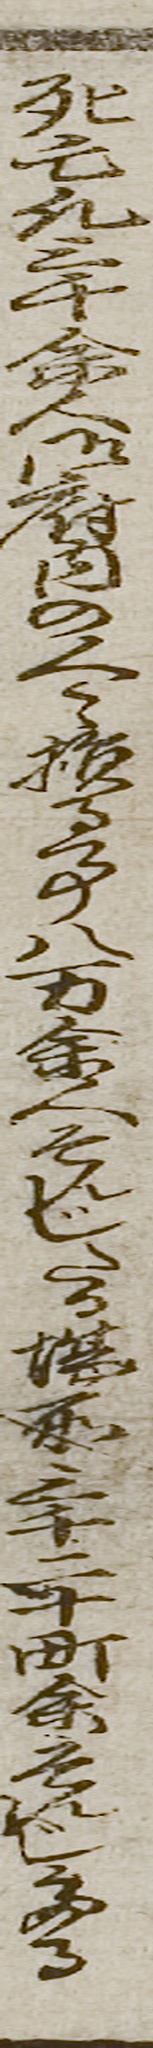死亡凡三千余人御府内の人々損る事八万余人そんじたる場所三千二十町余そんじたる
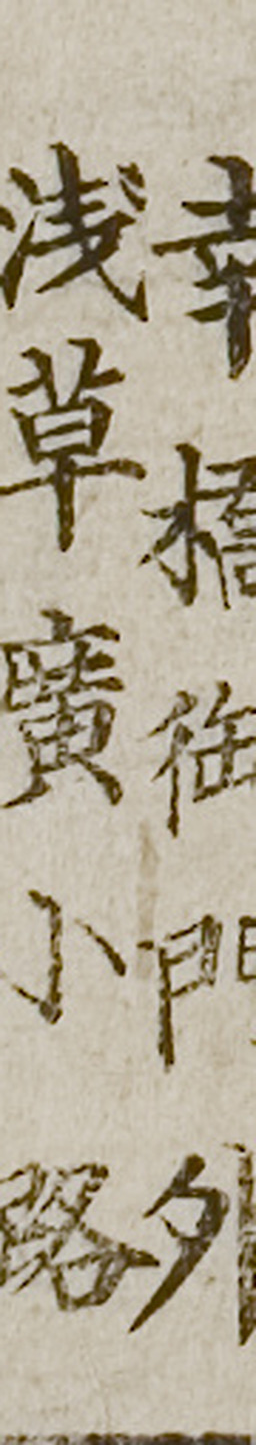浅草広小路
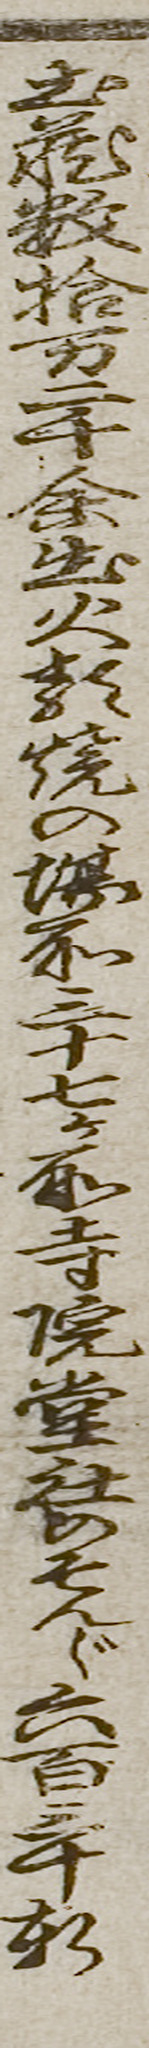土蔵数拾万二千余出火類焼の場所三十七ヵ所寺院堂社のそんじ六百三十軒
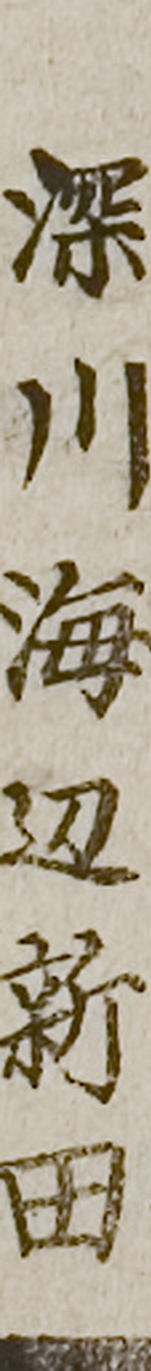深川海辺新田
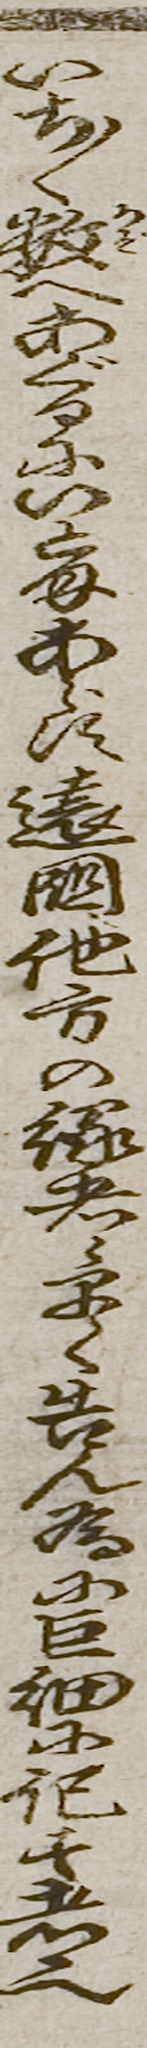いち〳〵数へあぐるにいとまあらず遠国他方の縁者に早く告ん為に巨細に記す者也
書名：江戸大地震出火場所分
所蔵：東京大学総合図書館 General Library in the University of Tokyo, JAPAN
